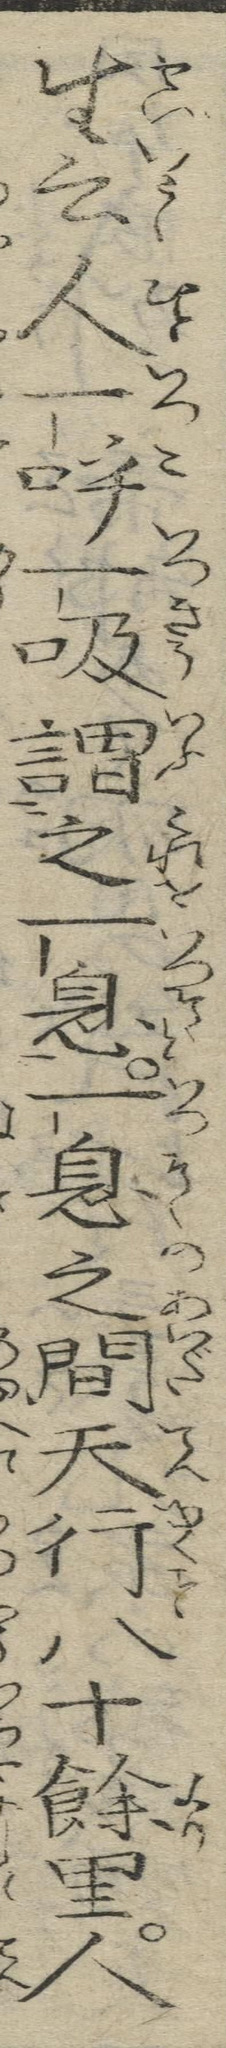生云人一呼一吸謂之一息。一息之間天行八十余里。人
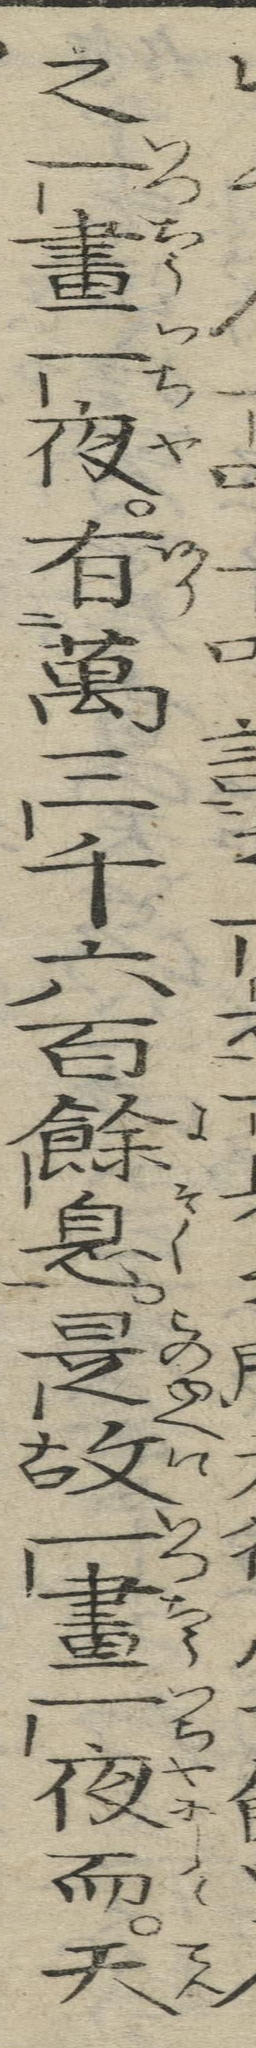之一昼一夜。有万三千六百余息。是故一昼一夜而。天
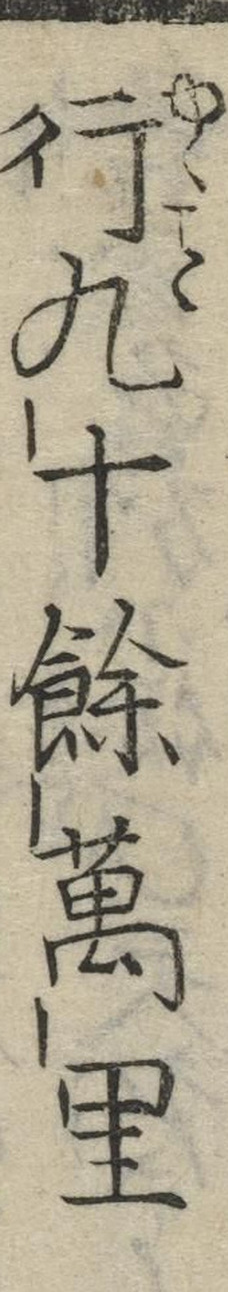行九十余万里
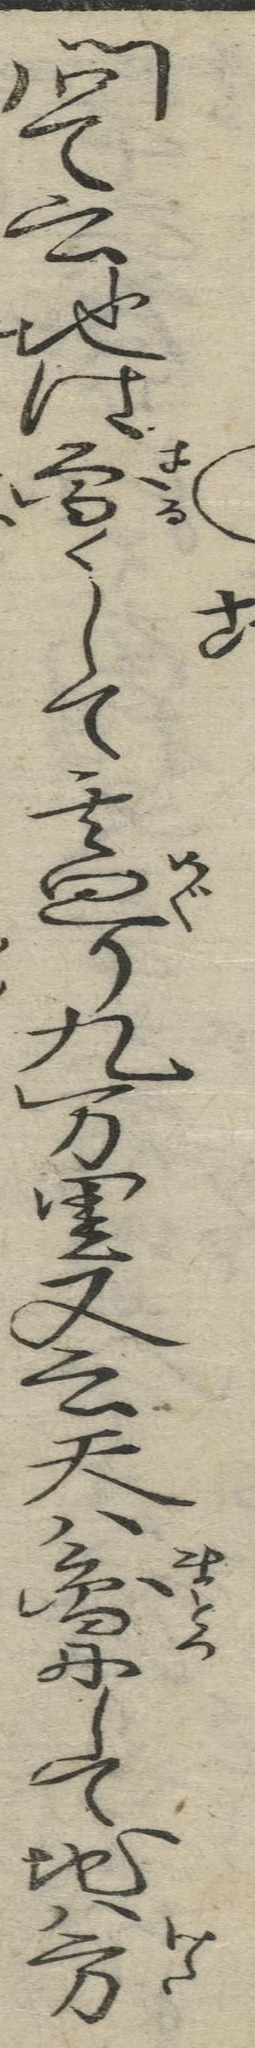問て云地は圓くして其廻り九万里又云天は圓にして地は方
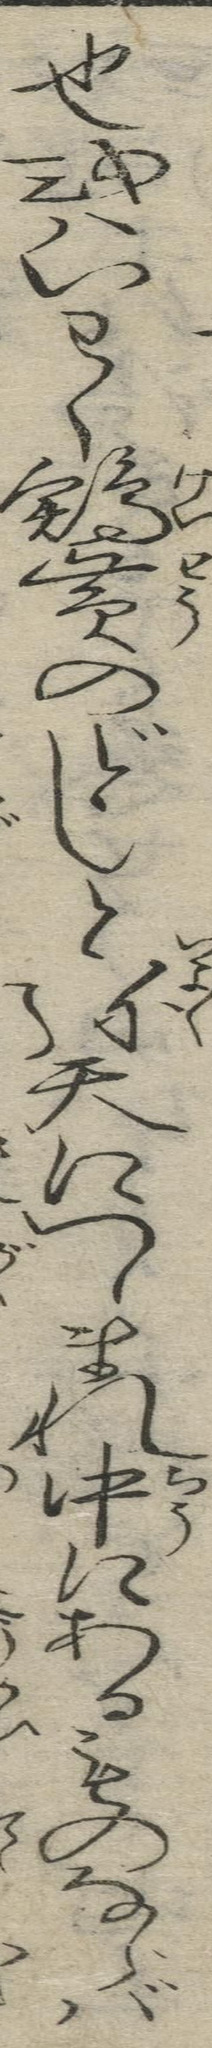也或はいわく鶏黄のごとしと弥天につゝまれ中にあるものならば
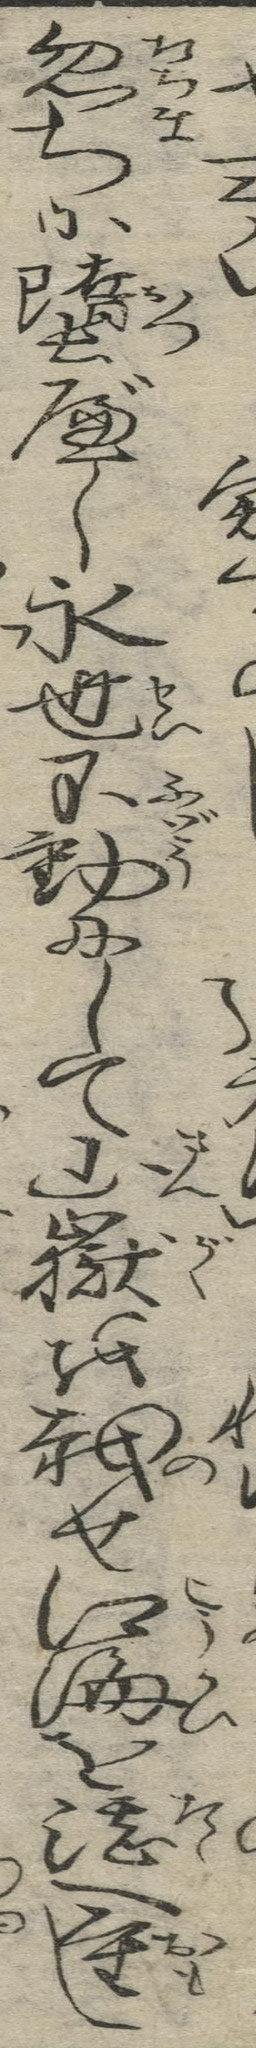忽ちに堕べし永世不動にして山嶽を載せ江海を湛へ重し
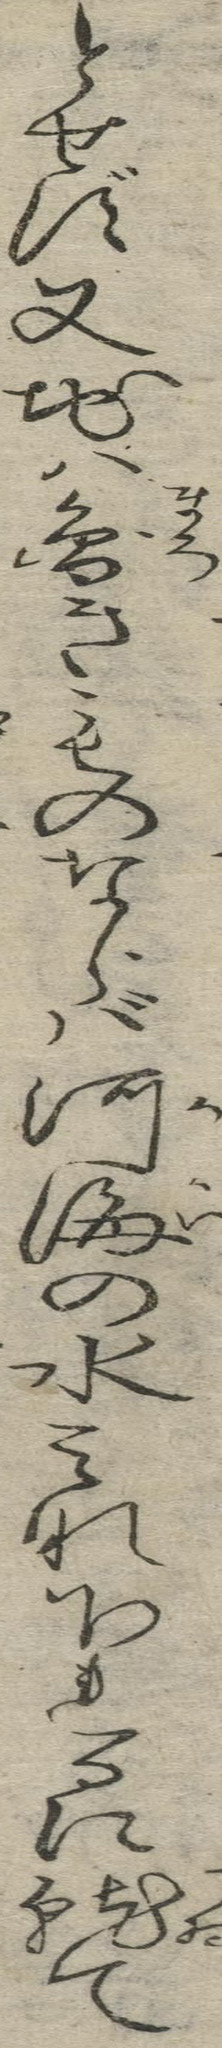とせず又地は圓きものならば河海の水みな下れるに就て
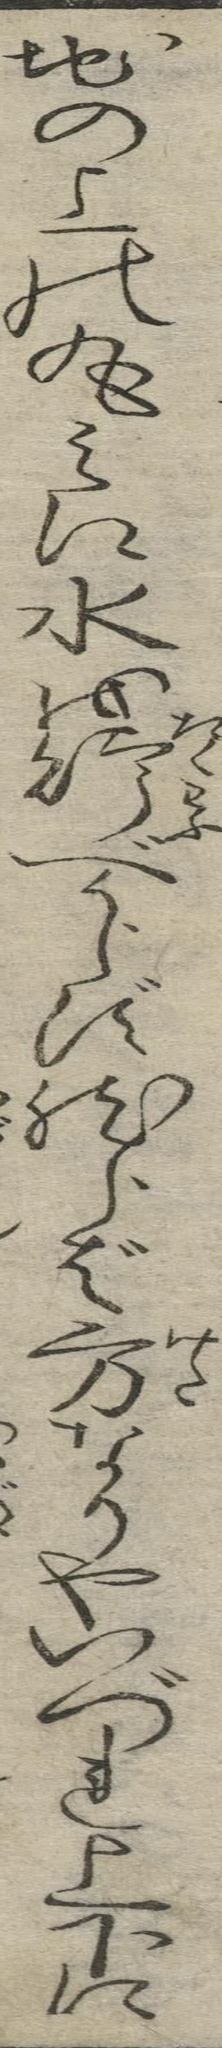地の上の丸みに水を貯べからず然らば方なりやいづれ上下に
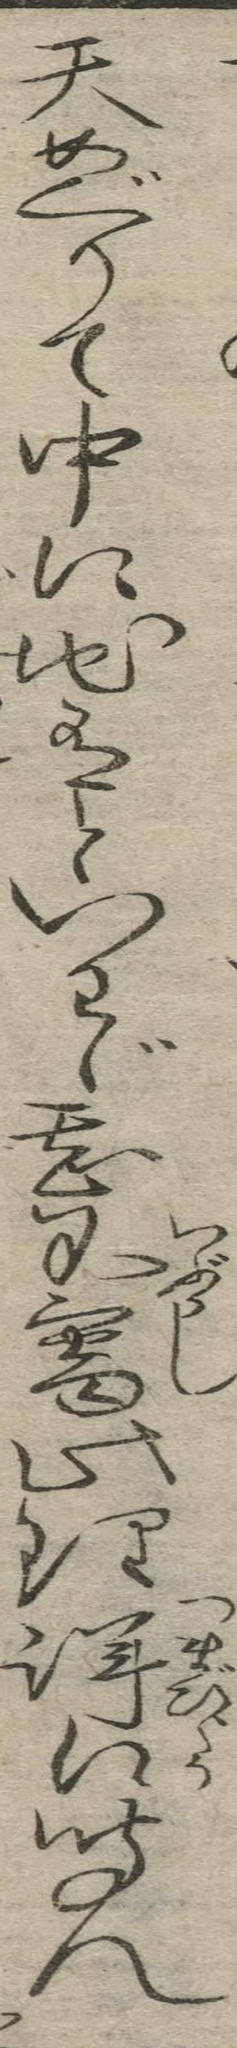天めぐりて中に地有といわゞ甚不審此理詳に聞ん
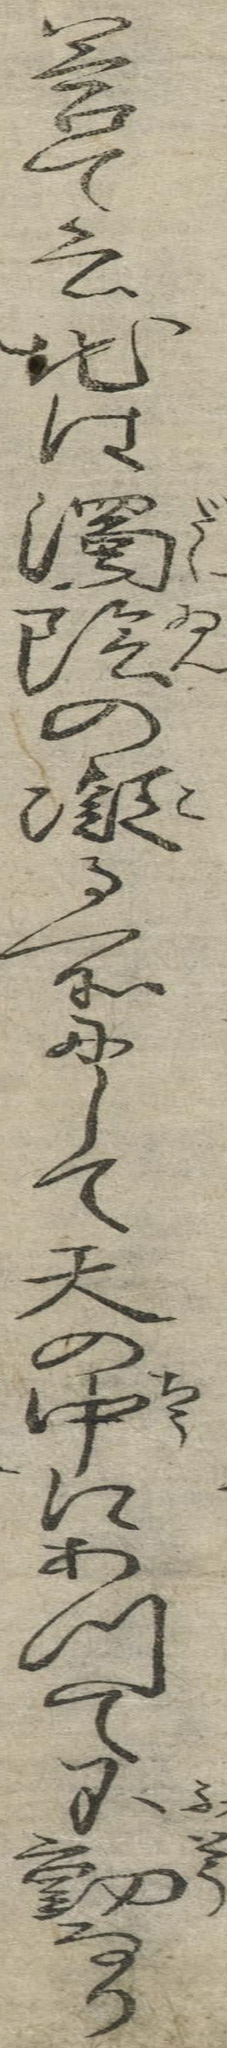答て云地は濁陰の凝る所にして天の中にあつて不動なり
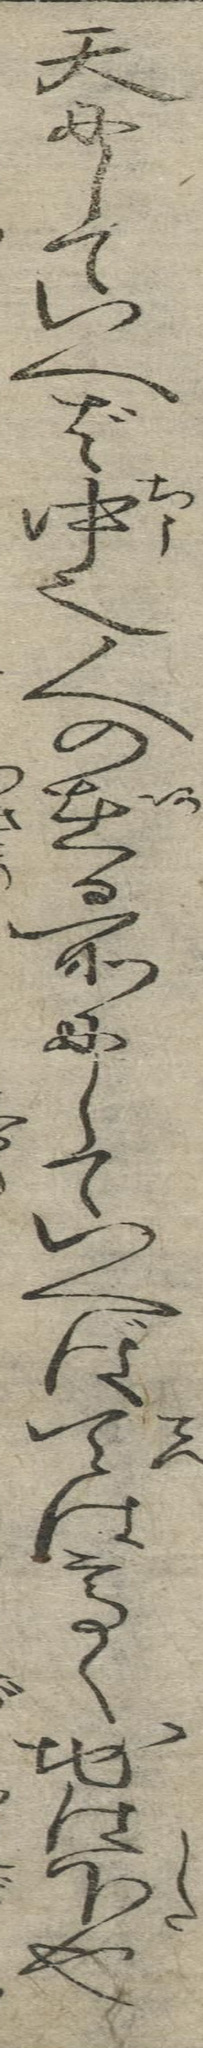天にしていへば中也人の在る所にしていへば天は高く地は下也
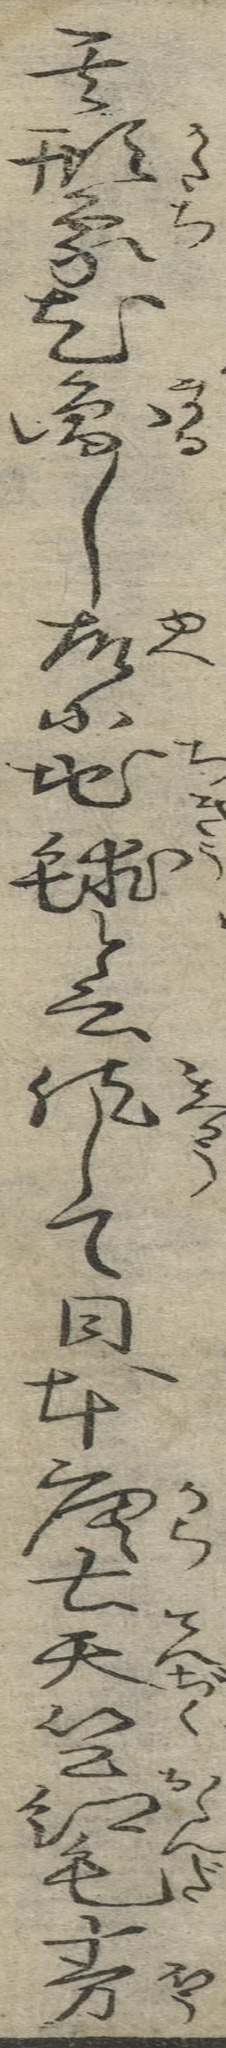其形象尤円し故に地毬と云値して日本唐土天竺紅毛十方

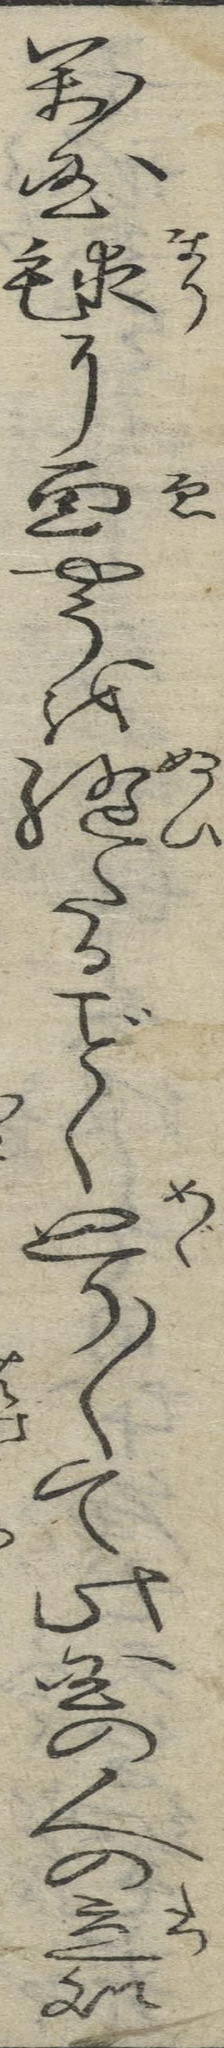万国毬に画やうを縫たるごとく廻り〳〵て此国の人の立処
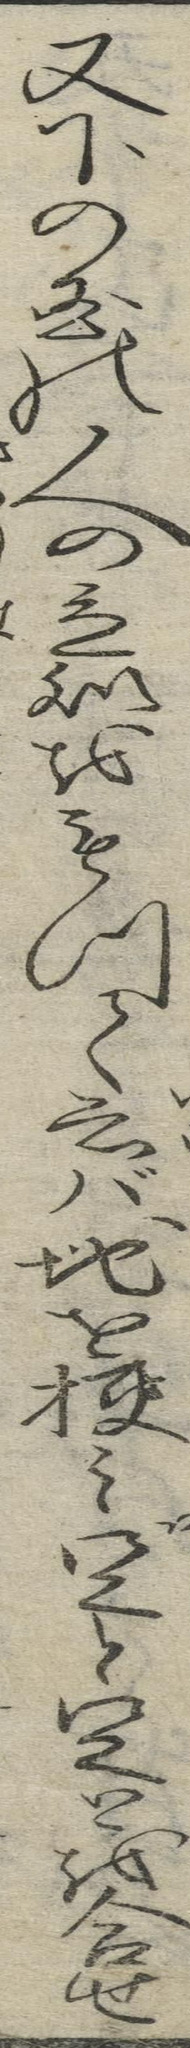又下の国の人の立処をもつて云ば地を挟み足と足とを合せ
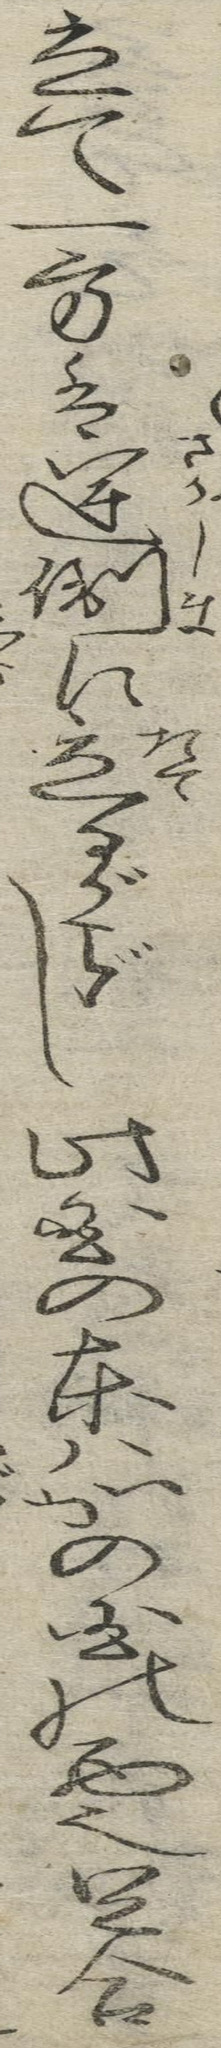立て一方は逆倒に立るがごとし此国の東はかの国の西也足合
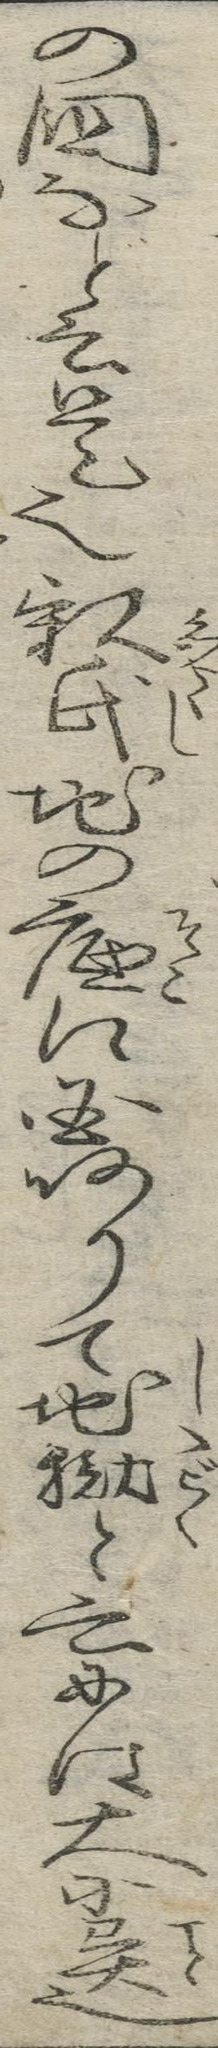の国なと云是也釈氏地の底に国ありて地獄と云には大に異也
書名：訓蒙天地辨　天
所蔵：東京大学地震研究所図書室 Earthquake Research Institute Library, The University of Tokyo, JAPAN
